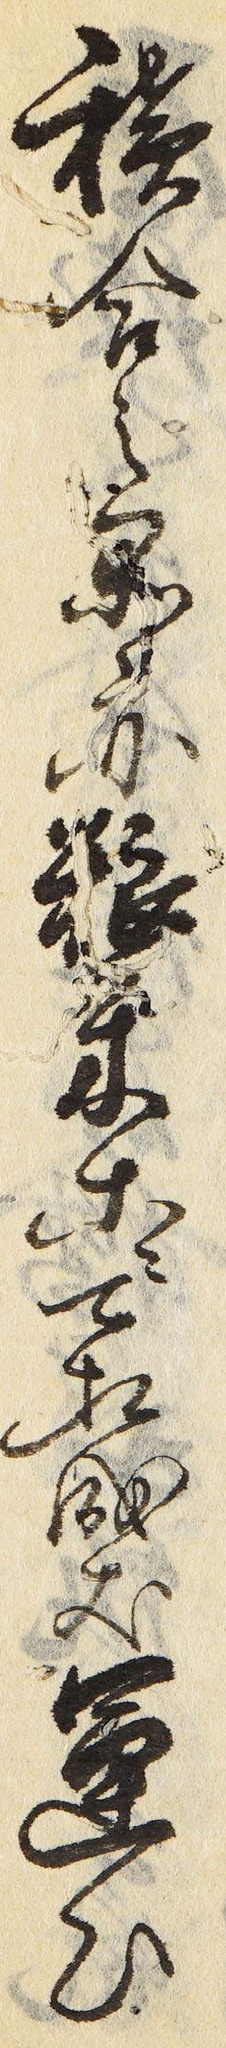積合之品亦粮米等ニ可相成丈運ひ
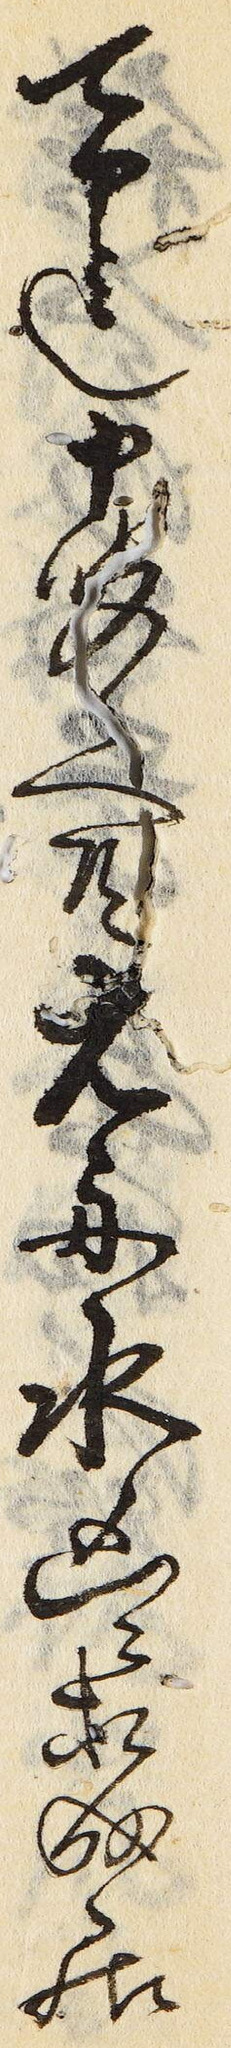可申申聞候へ共右舟水込ニ相成居
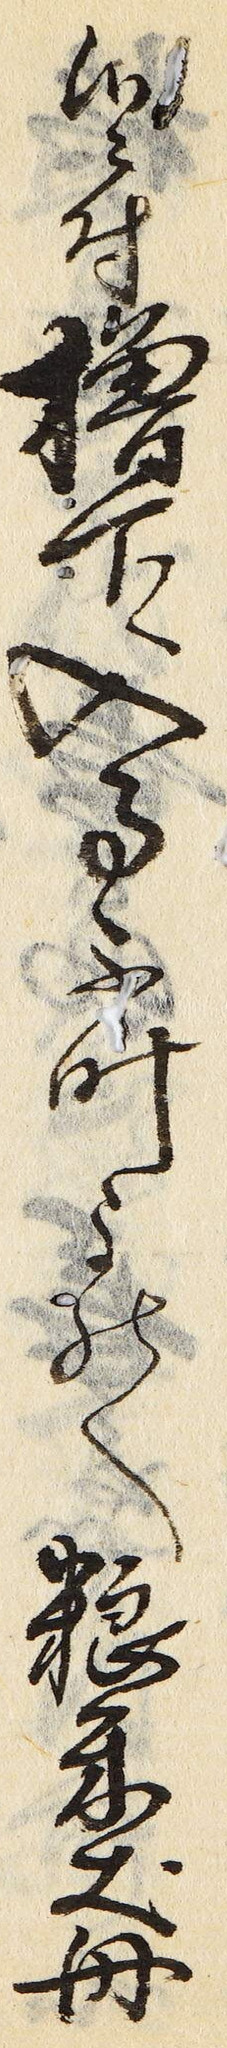候ニ付櫓下へ入事不叶よの〳〵？粮米丈丹
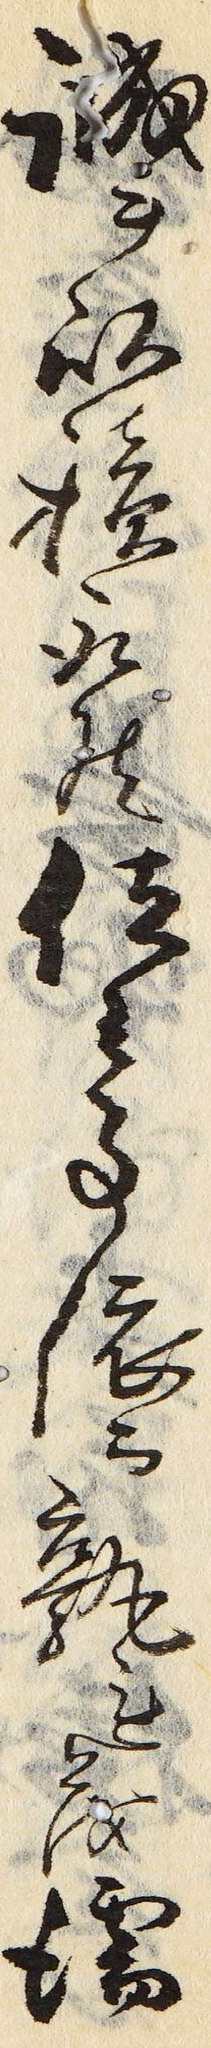誠ヲ以積取候位之事依而孰れも濡
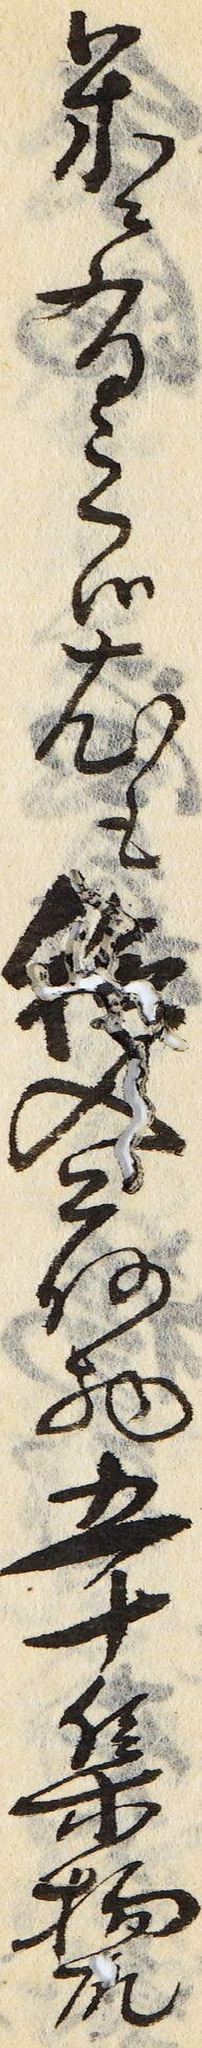米ニ有之候尤も積入荷物五十集物故
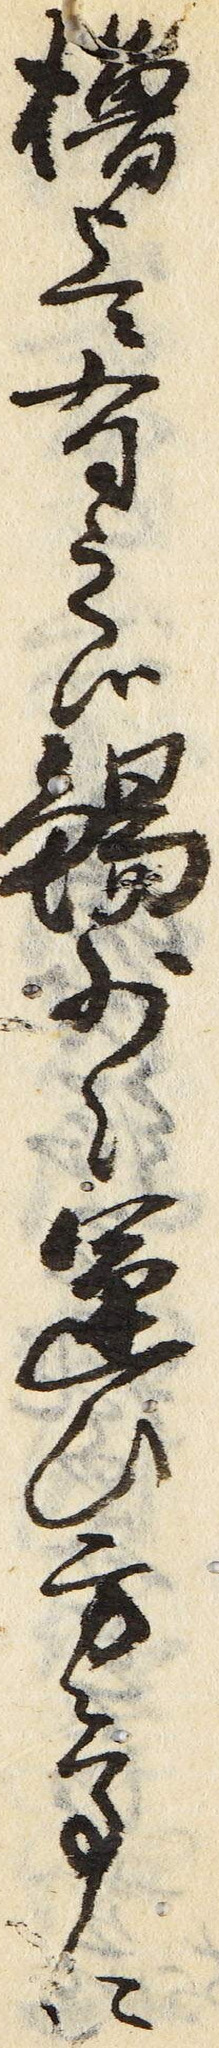櫓上ニ有之候鯣少し運び方々事ニ
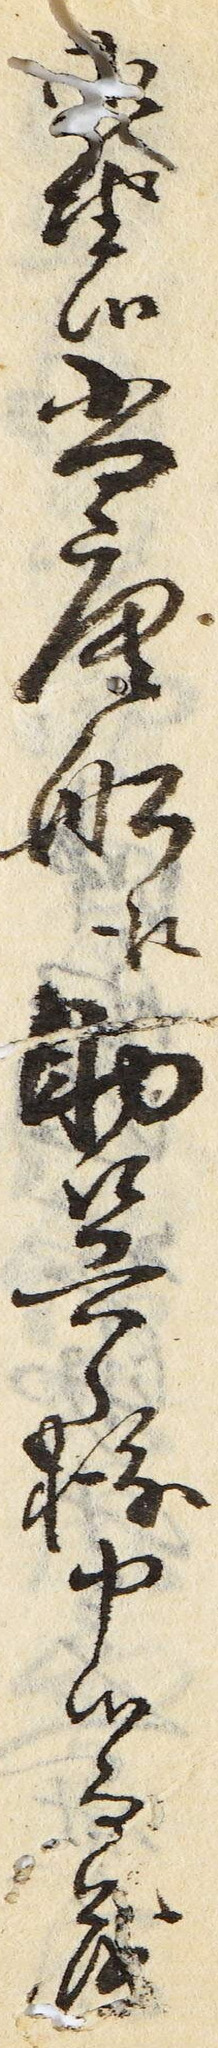御座候尚唐船え助呉候様申候而も
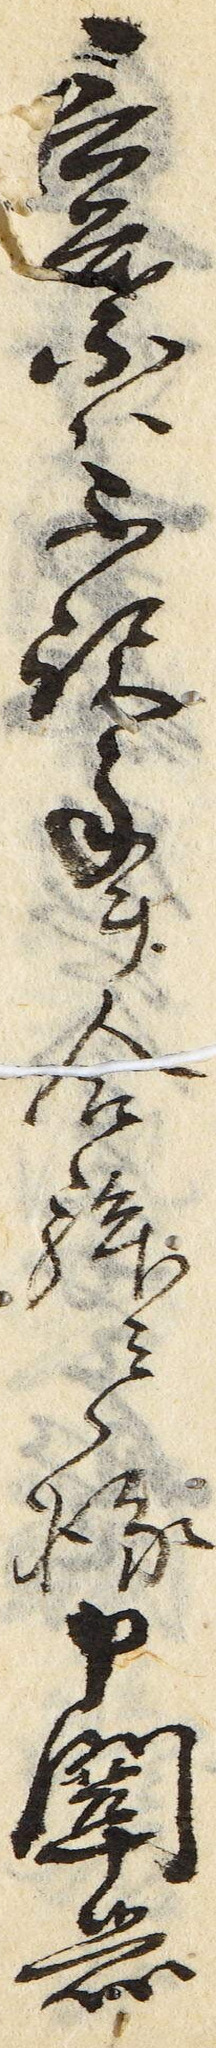言葉ハ不訳手ヲ合拝ミ候様申聞候所
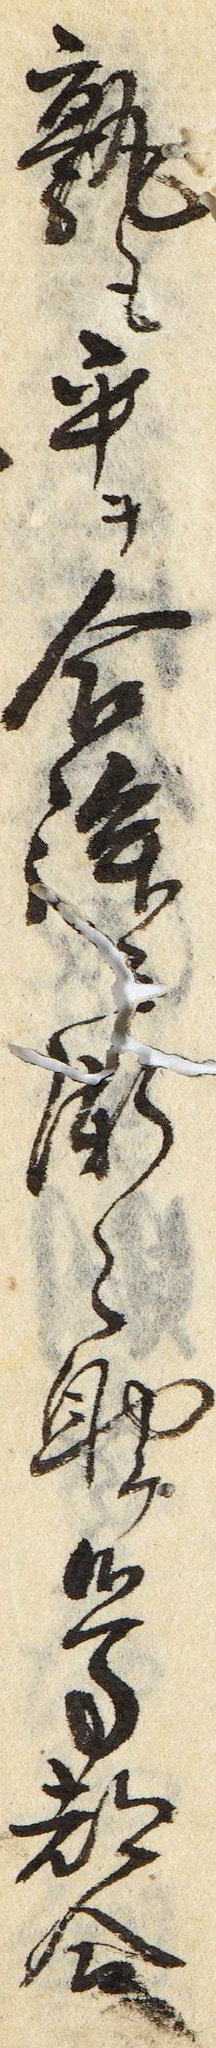孰も手ヲ合拝ミ漸々助ケ候事都合
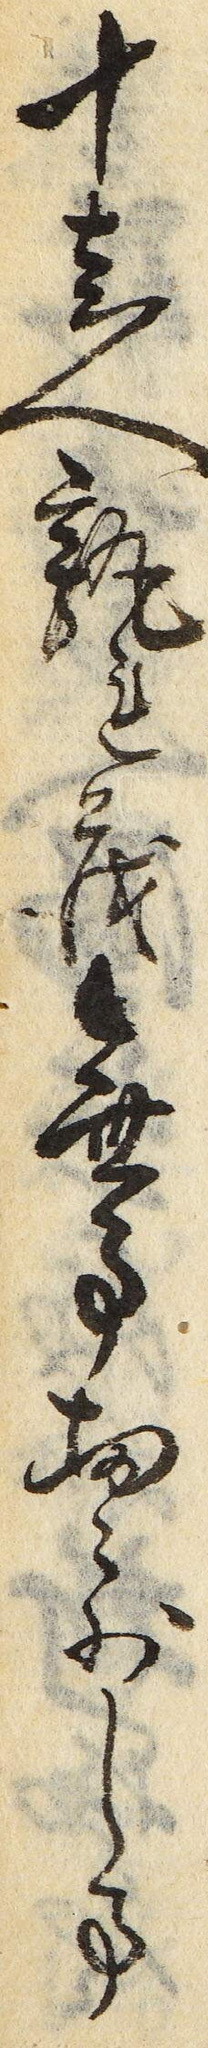十壱人孰れも無事扨々少し事

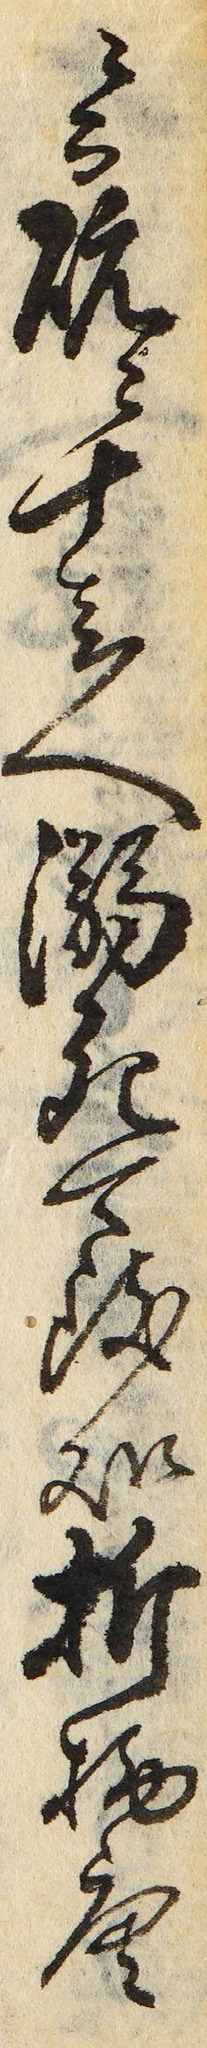ニ而既ニ十壱人溺死可致処折柄唐
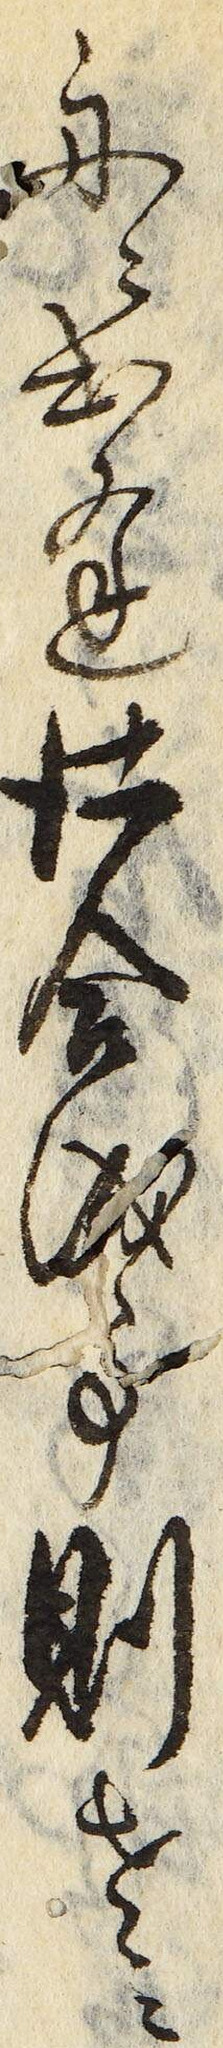舟ニ出逢仕合成事則左ニ
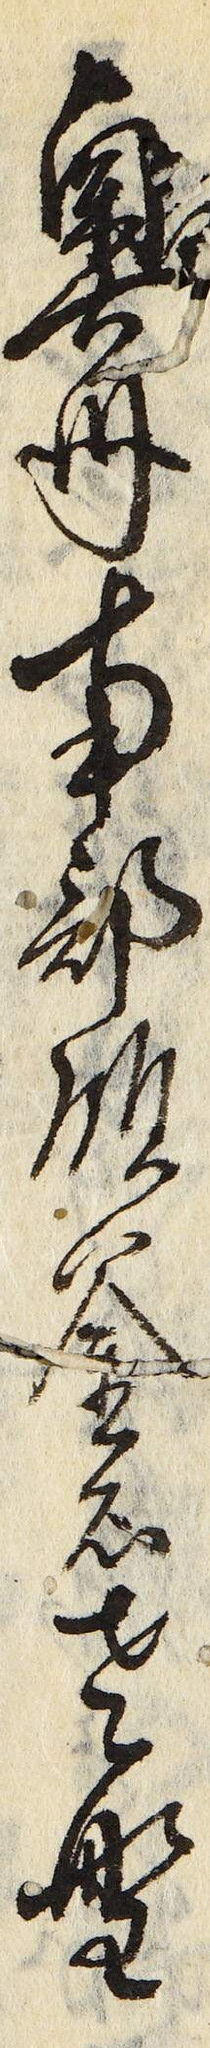奥州南部領釜石左野
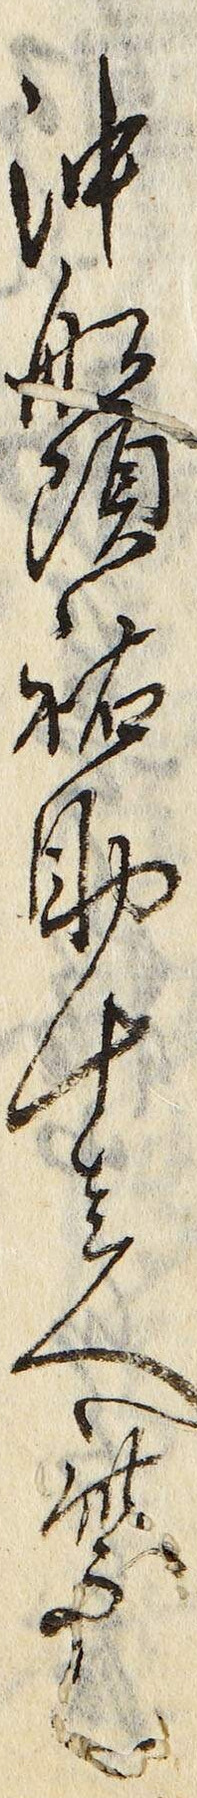沖船頭祐助十壱人乗
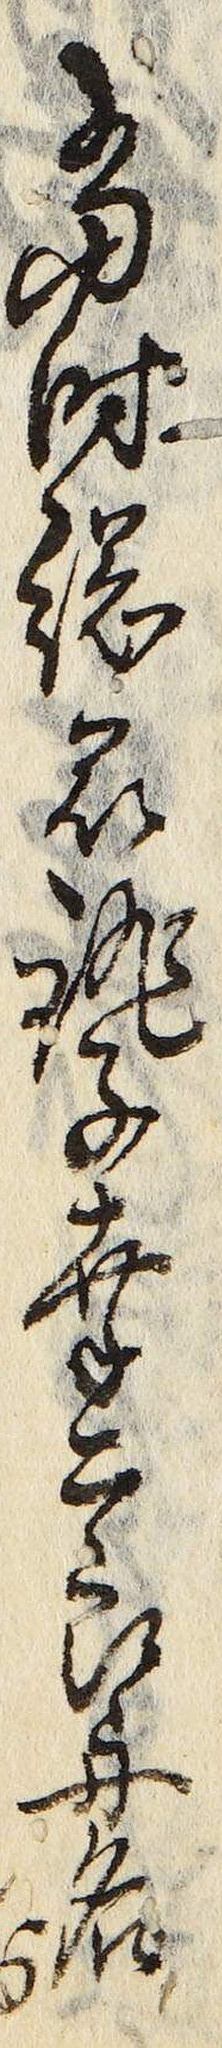当時総州銚子幸二郎舟名前
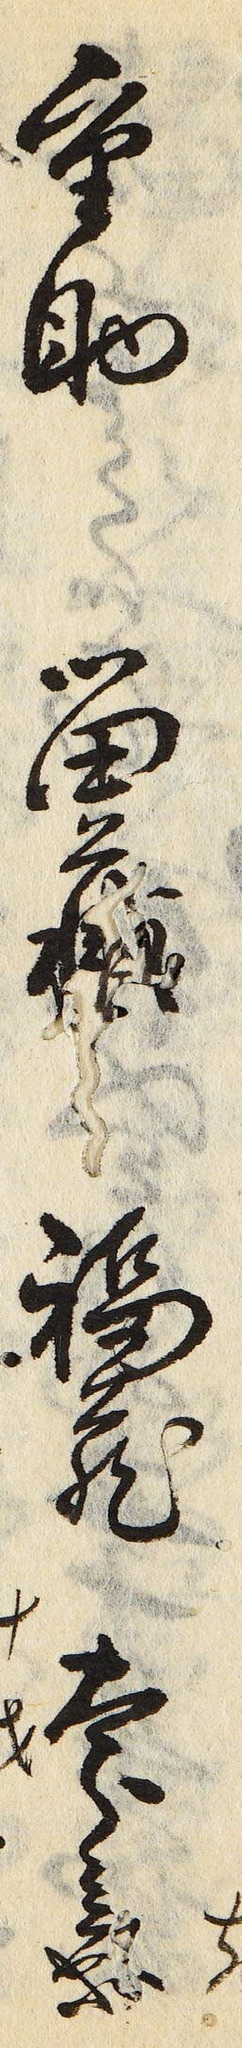重助留蔵福蔵太郎兵衛
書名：阿波幸宝丸漂流記
